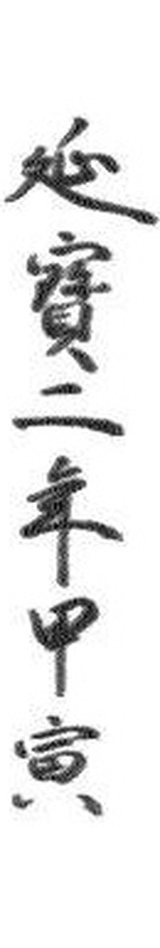延宝二年甲寅
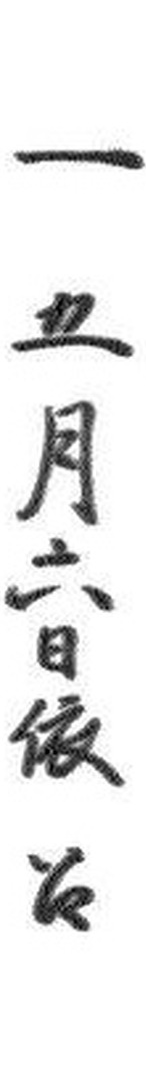一五月六日依召
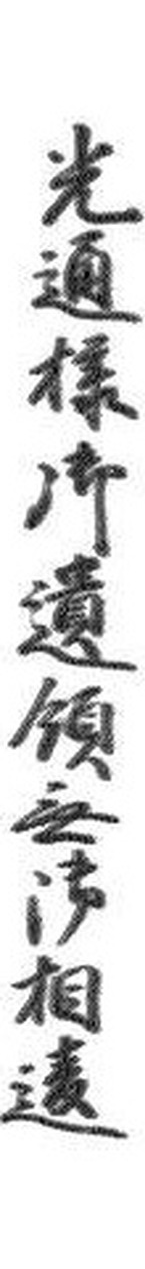光通様御遺領無御相違

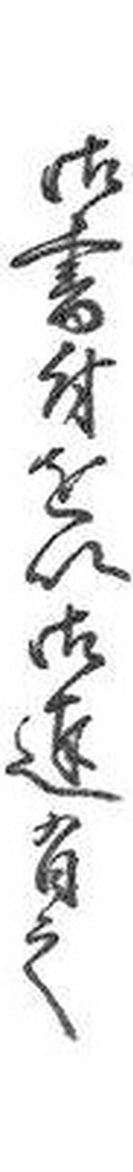御書付を以御達有之
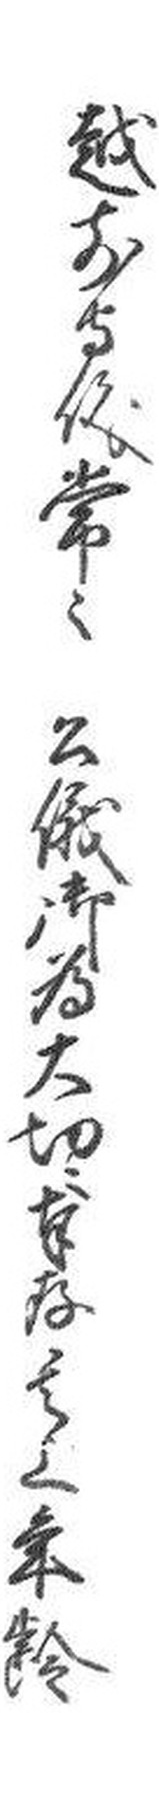越前守儀常々公儀御為大切ニ奉存其上年齢
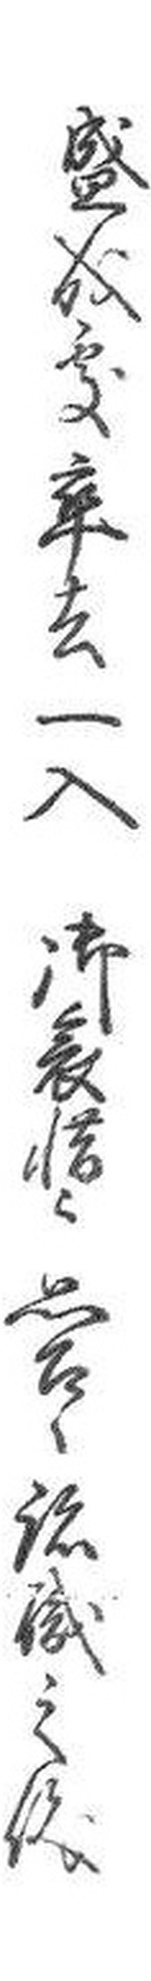盛成処卒去一入御哀惜被思召候跡職之儀
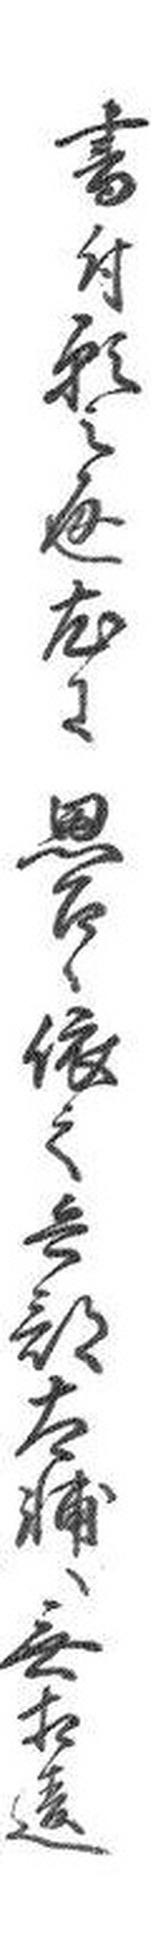書付願之通尤に思召候依之兵部大輔ヘ無相違
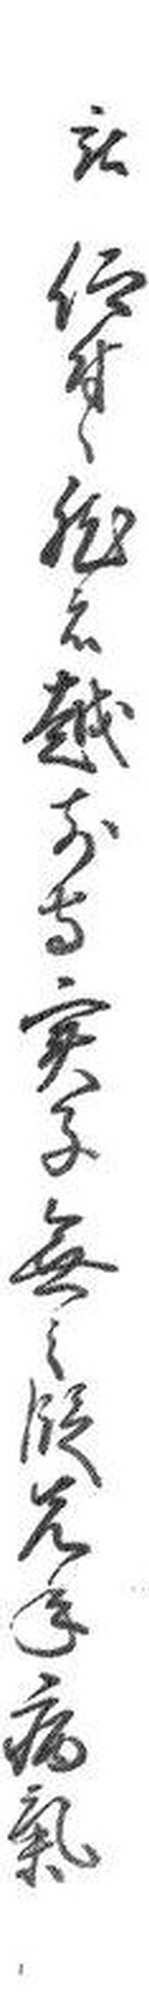被仰付候然者越前守実子無之段先年病気
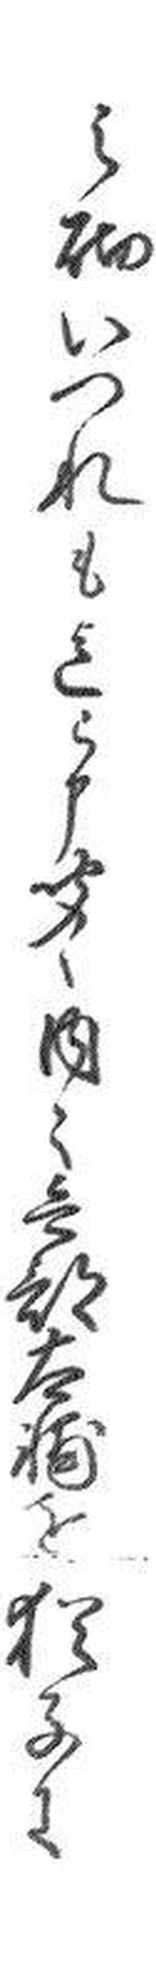之砌いつれも迄被申聞候内々兵部大輔を猶子に
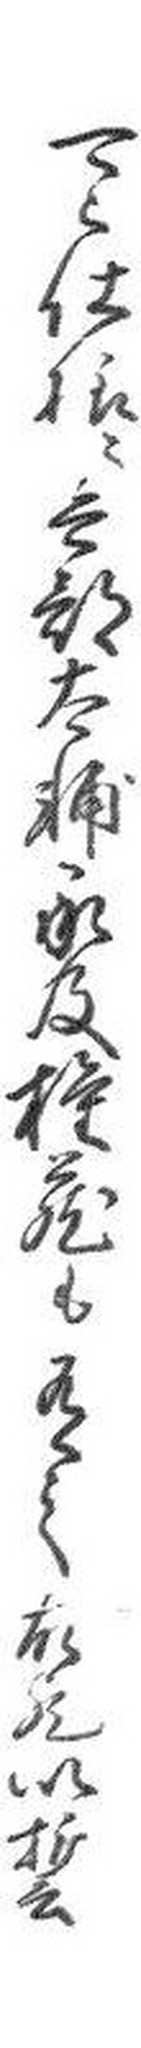可被仕様ニ兵部大輔承及権蔵も有之故歟以逝誓
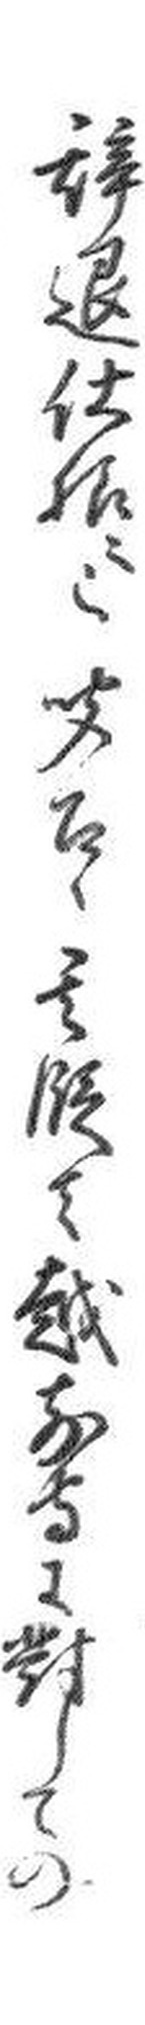辞退仕様ニ被聞召候其段者越前守に対しての
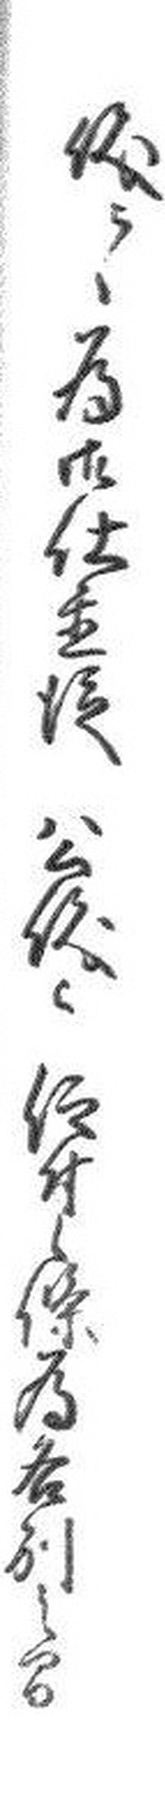義ニ候為御仕置従公儀被仰付候条為各別之間
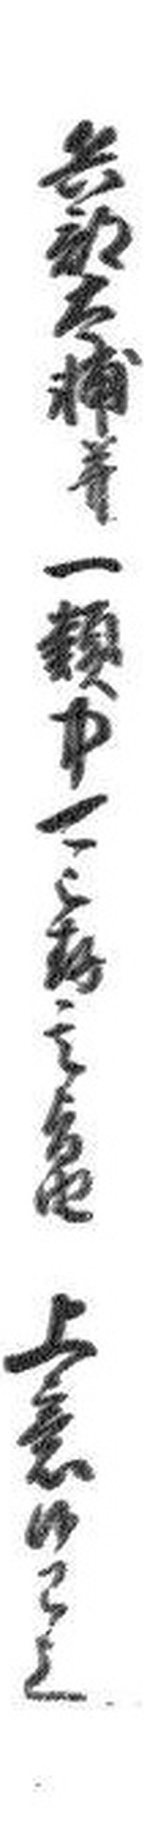兵部大輔幷一類中可被存其旨由上意候已上
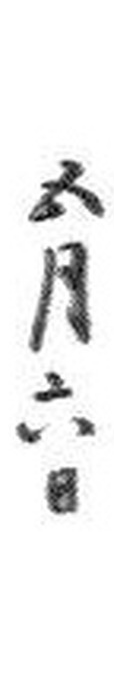五月六日
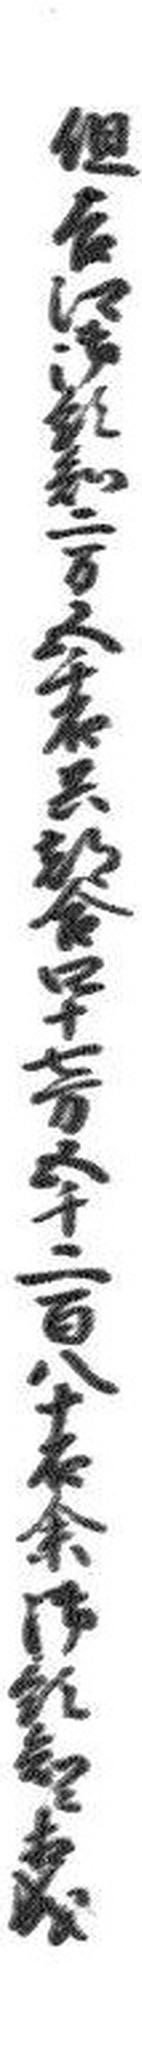但吉江御領知二万五千石只都合四十七万五千二百八十石余御領知ニ相成
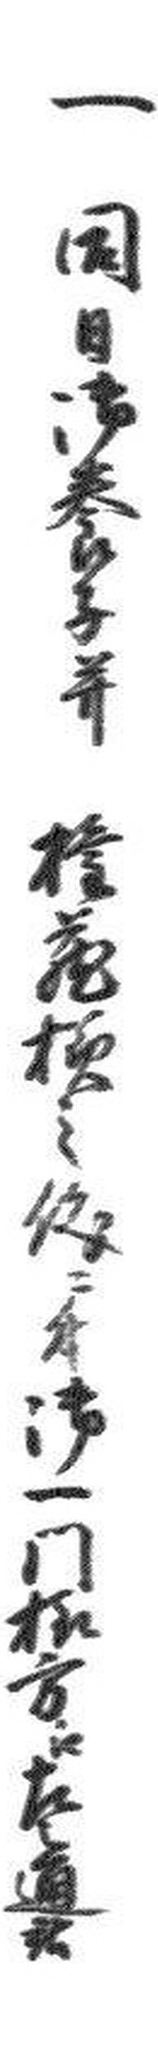一同日御養子并権蔵様之儀ニ付御一門様方江左之通被
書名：家譜 十一 昌親公 従延宝二年到延宝四年八月
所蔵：福井県文書館 Fukui Prefectural Archives
